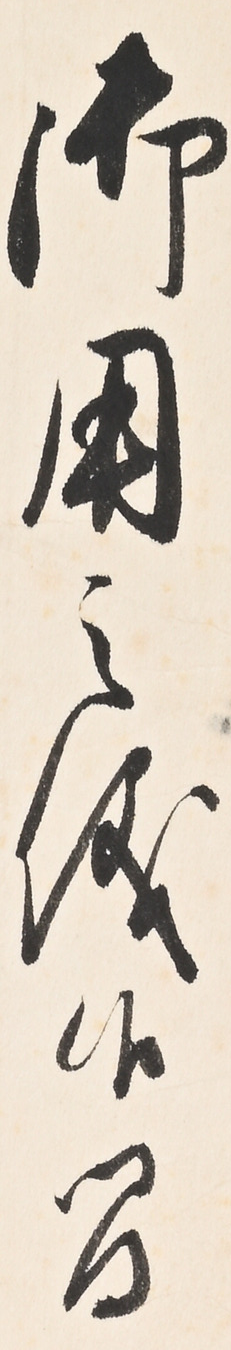御用之儀候間
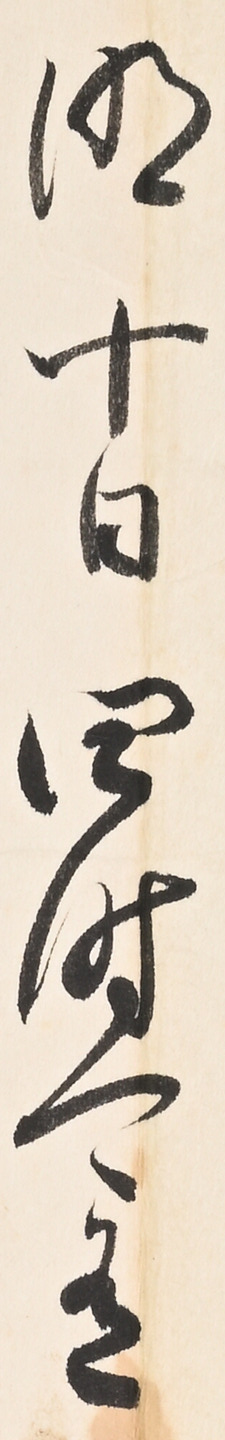明十日四時可有
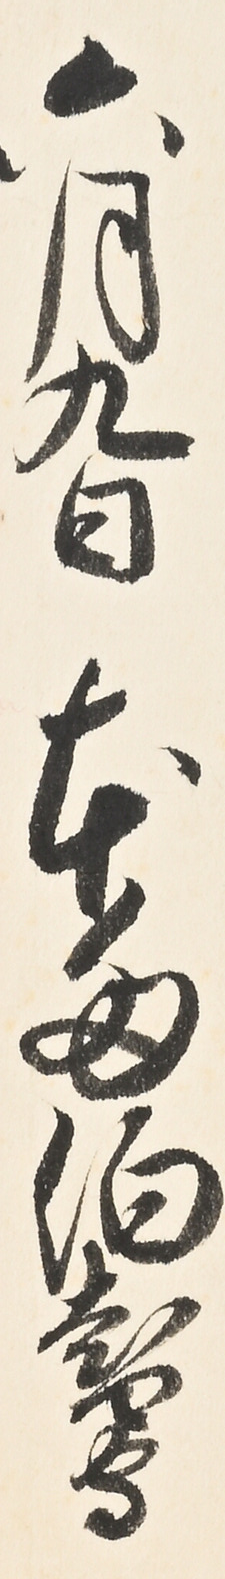六月九日本多伯耆守
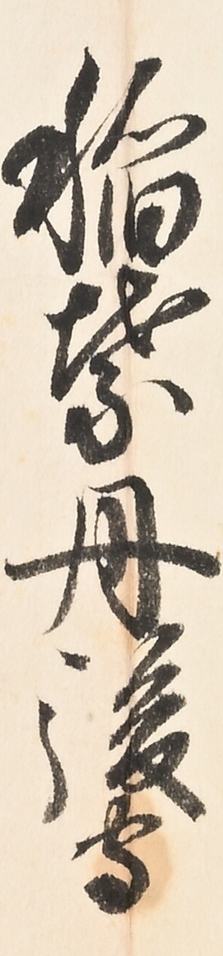稲葉丹後守
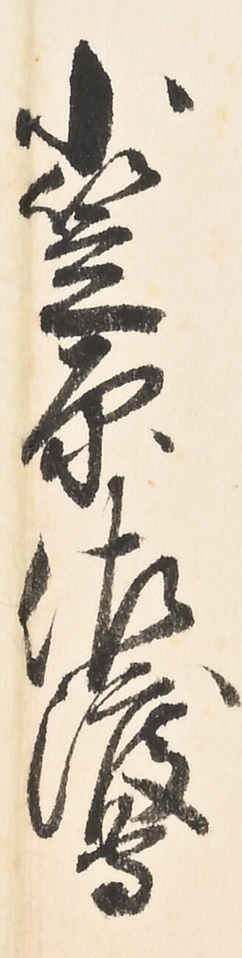小笠原佐渡守
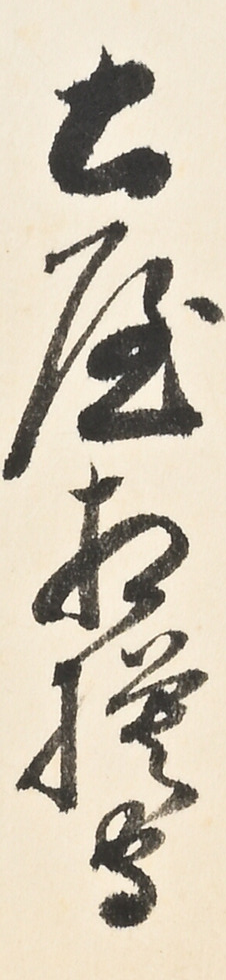土屋相模守
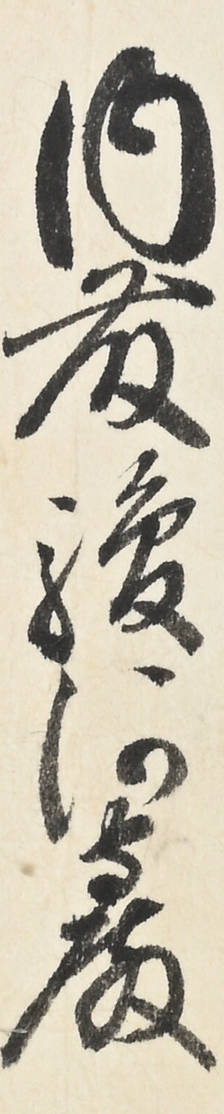内藤駿河守殿
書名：（書状）
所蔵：伊那市立高遠町図書館・合同会社AMANE
